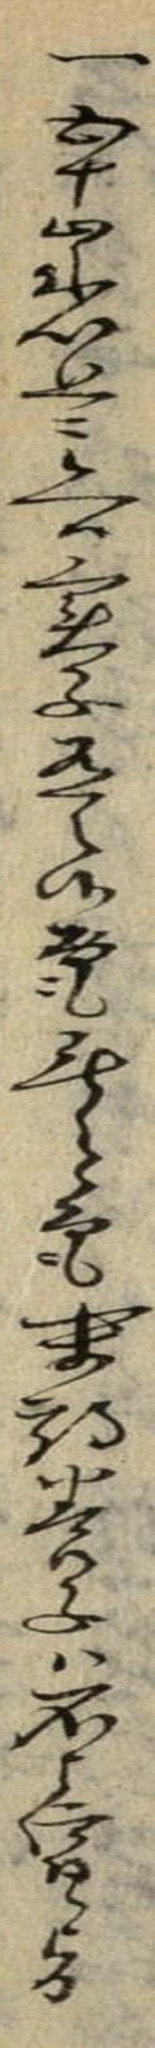一五十歳以上ニ候ヘハ実子有之候而も無之候而も末期養子ハ不被仰付候旨
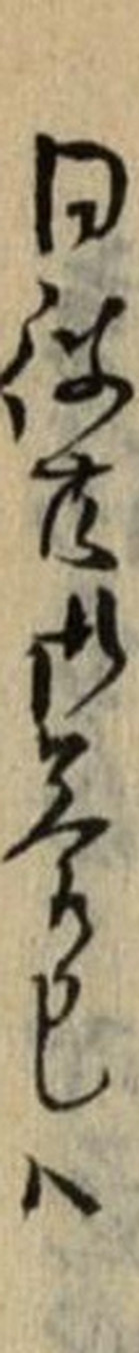同役共御答申し候ハ
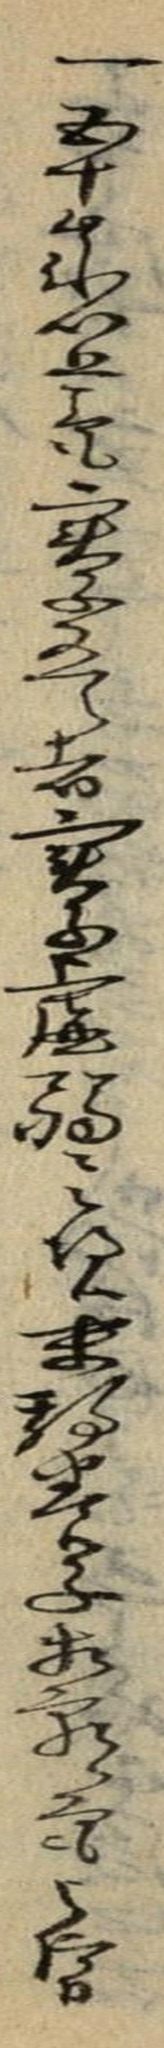一五十歳以上ニ而も実子有之者実子虚弱ニ候得ハ末期養子相願候而も被仰付
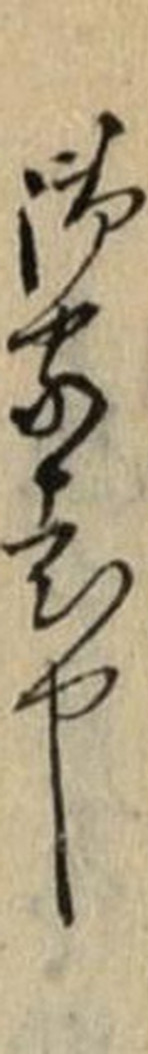御家老中
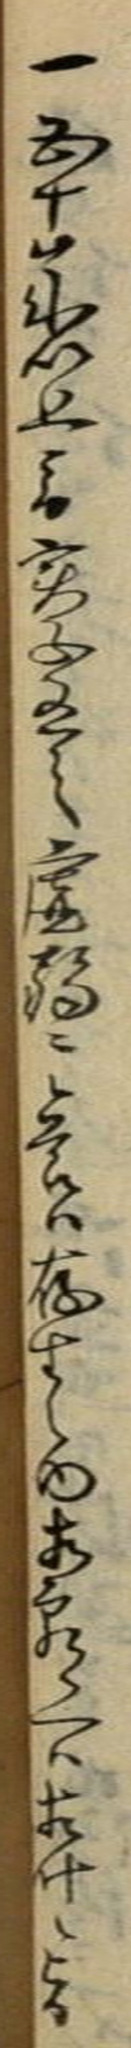一五十歳以上ニ而実子有之虚弱ニ候節ハ存生之内相願候へハ相叶候旨
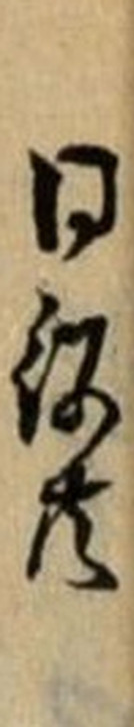同役共
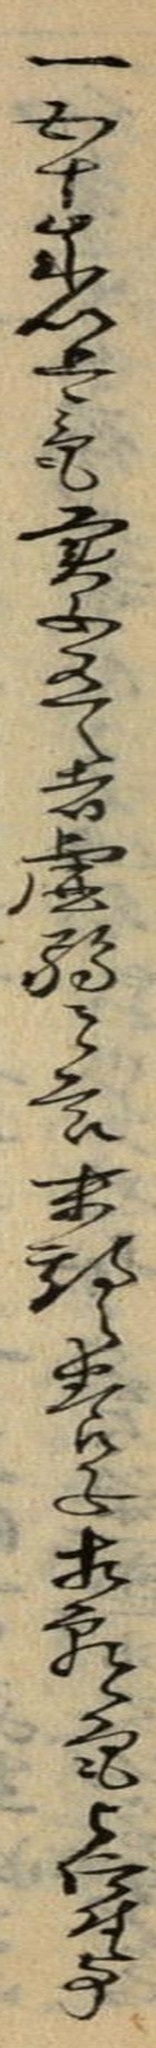一五十歳以上ニ而も実子有之者虚弱ニ候節末期養子相願候而も被仰付候事
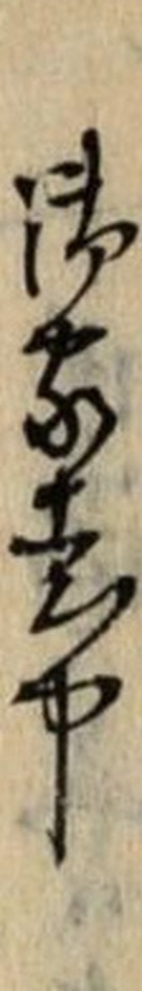御家老中
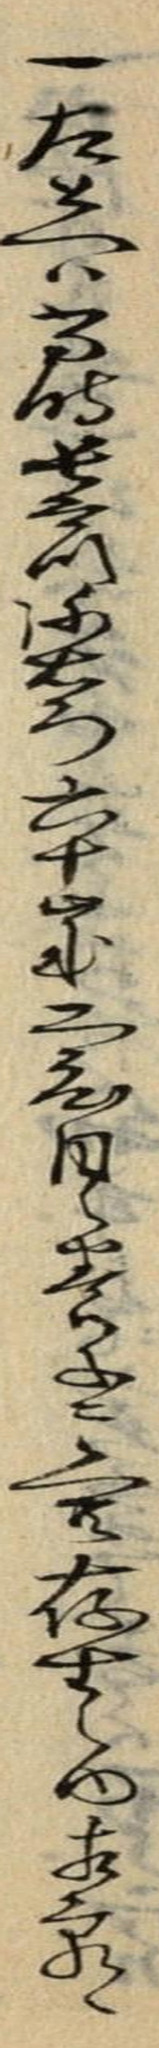一たとへハ当時長谷川弥右衛門六十歳二度目之養子ニ候へ共存生之内相願候
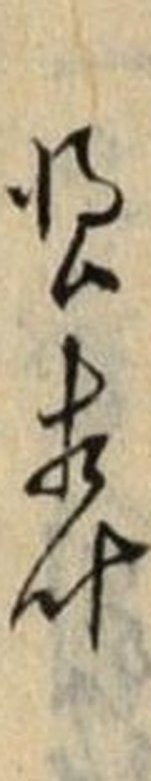得ハ相叶
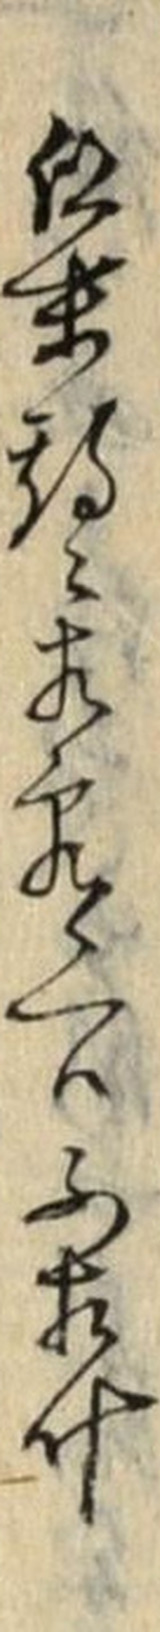但末期ニ相願候へハ不相叶
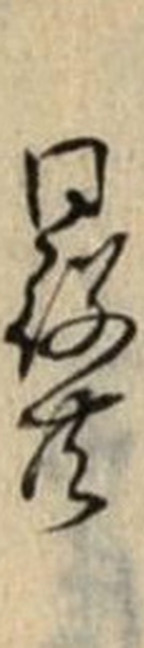同役共
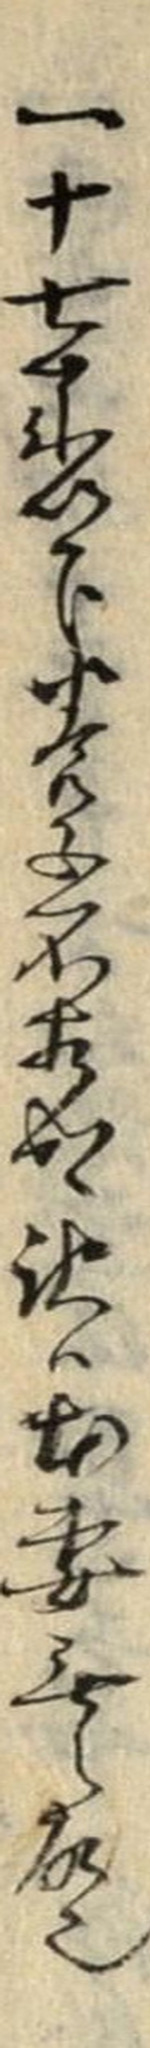一十七歳以下養子不相成候訳ハ本妻無之故也
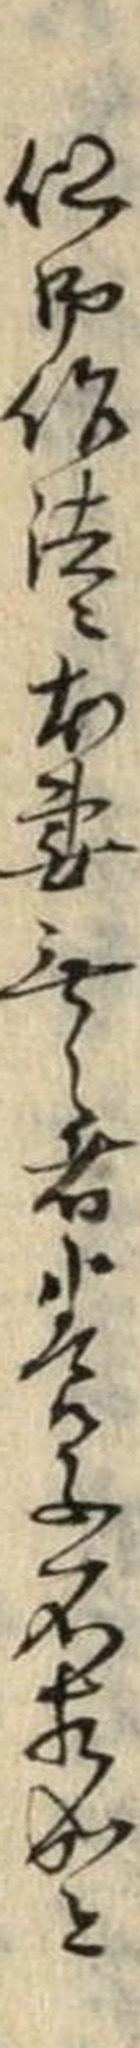但御作法ニ本妻無之者養子不相成と
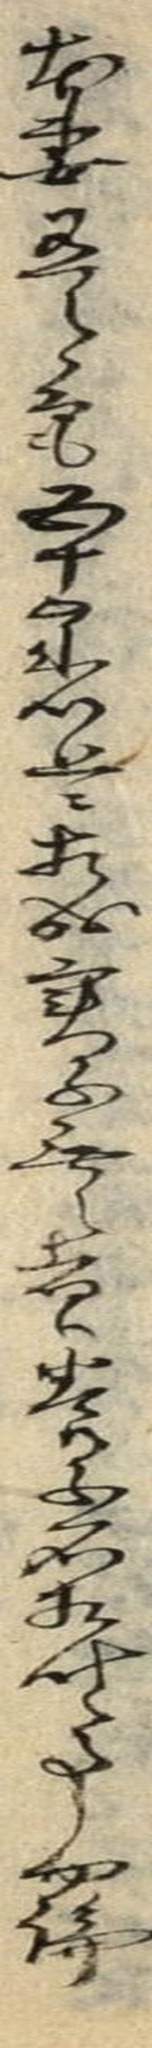本妻有之候而も五十歳以上ニ相成実子無之者ハ養子不相叶候事勿論
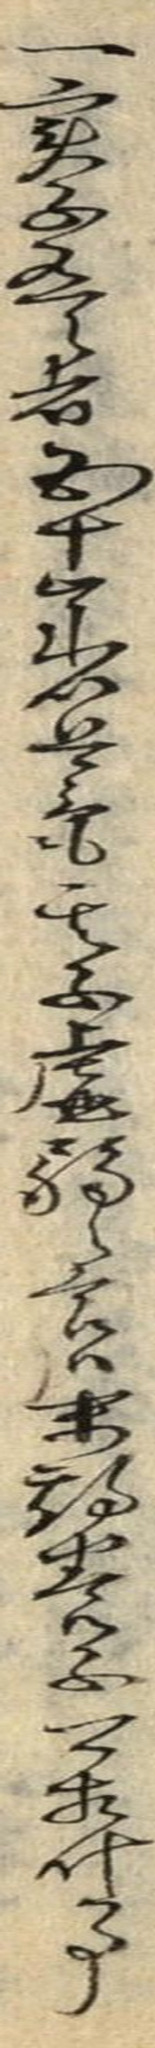一実子有之者五十歳以上ニ而も其子虚弱之節ハ末期養子可相叶事
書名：養子縁組之部
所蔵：福井県文書館 Fukui Prefectural Archives
